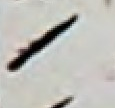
1
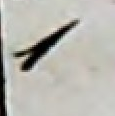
1
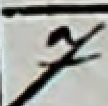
7
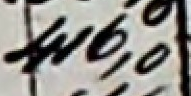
416,0
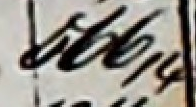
566,4
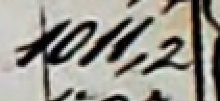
1011,2
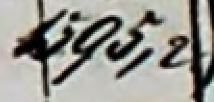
1595,2
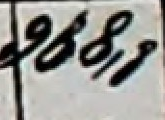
368,1
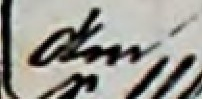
Am
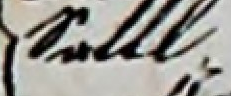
Sattl„
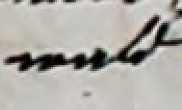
wald
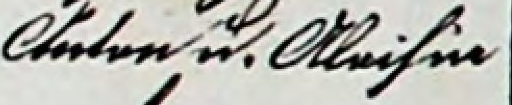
Anton u. Aleisin
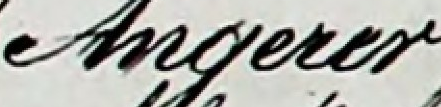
Angerer
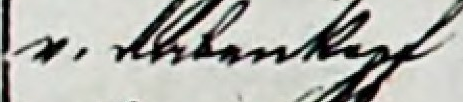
v. Rabenkopf
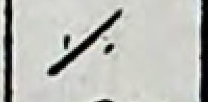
./.
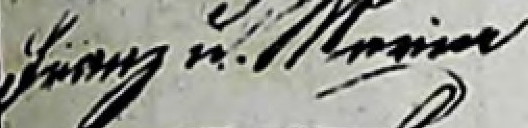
Franz u. Maria
